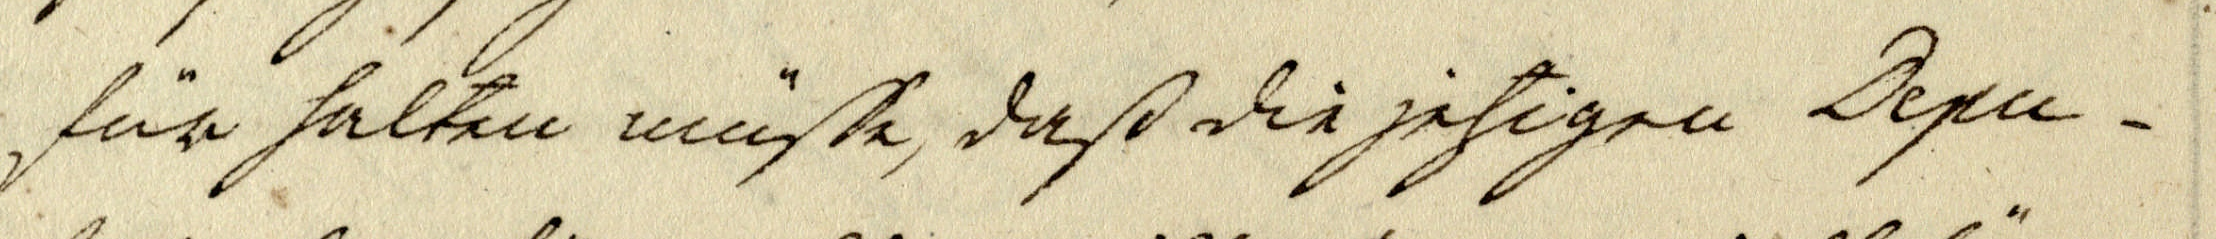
für halten müsse, daß die jetzigen Depu¬
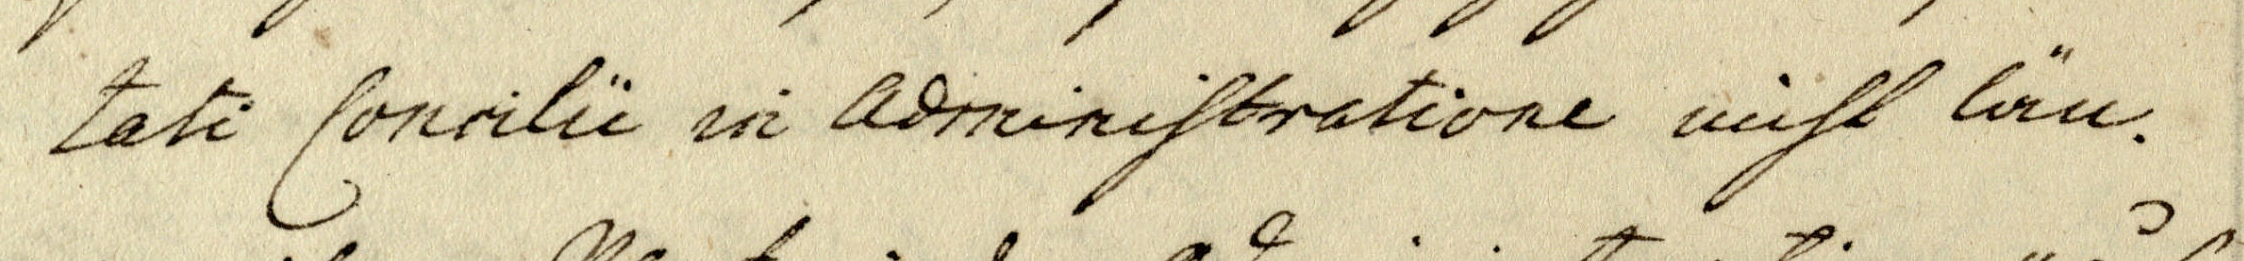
tati Concilii in Administratione nicht län¬
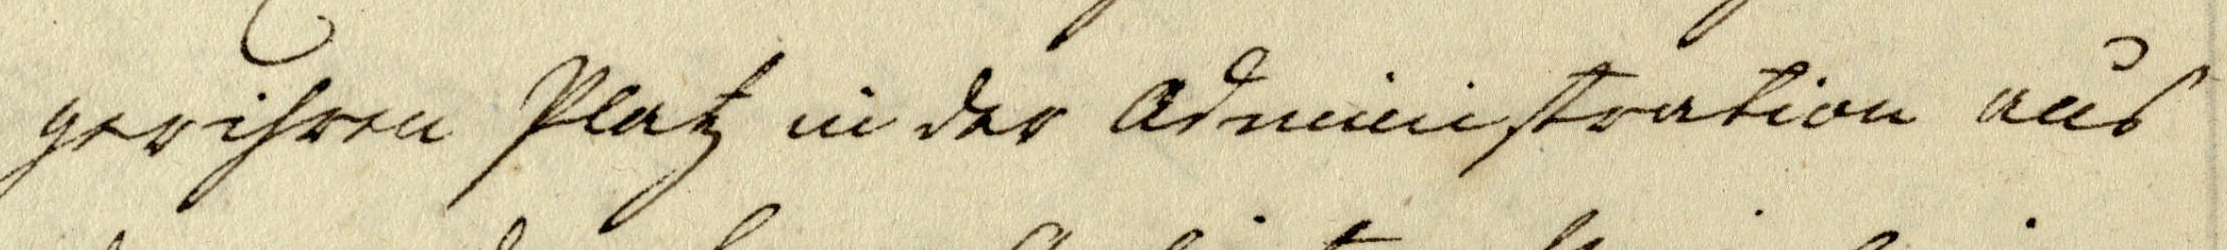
ger ihren Platz in der Administration aus
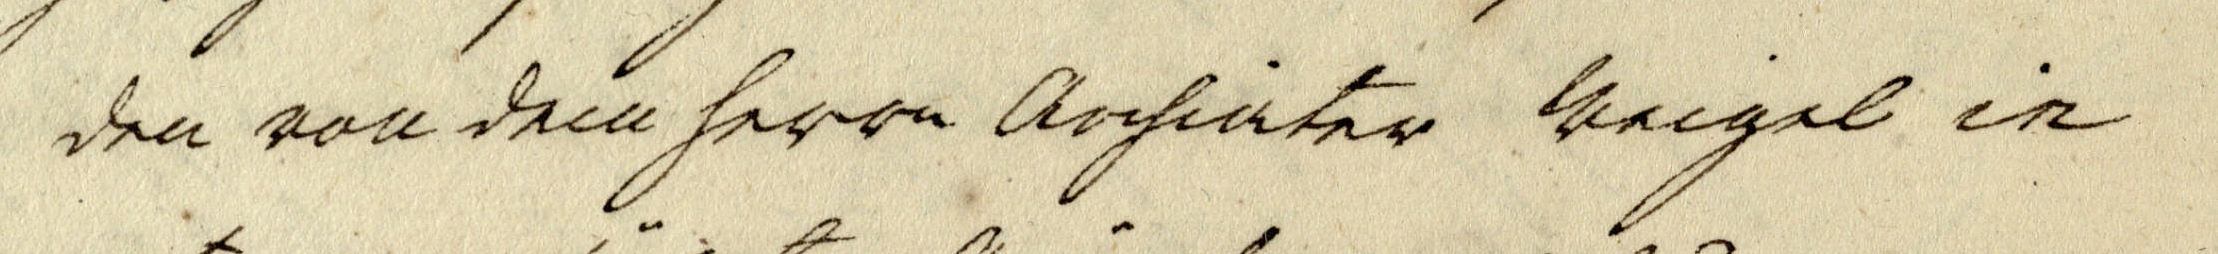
den von dem Herrn Archiater Weigel in
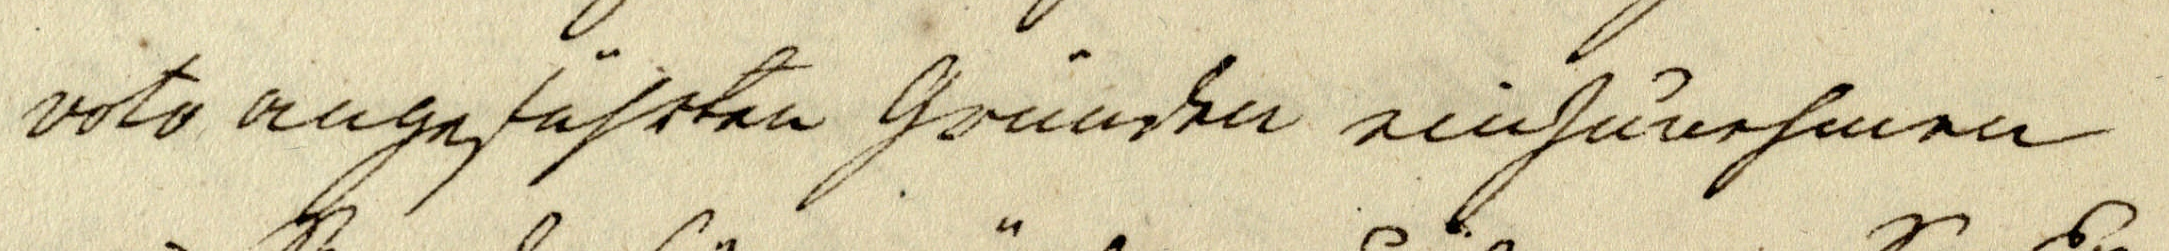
voto angeführten Gründen einzunehmen
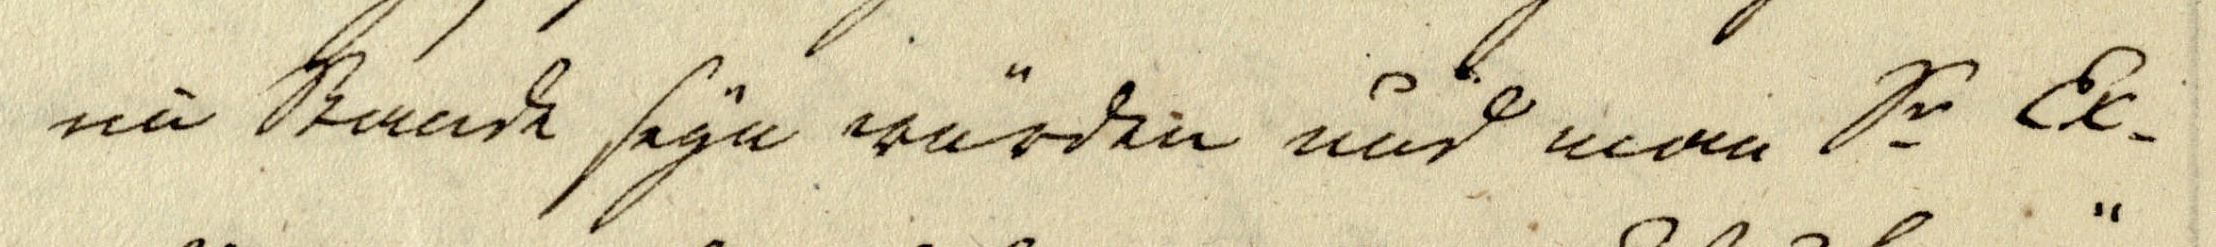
in Stande seÿn würden und man Sr Ex¬
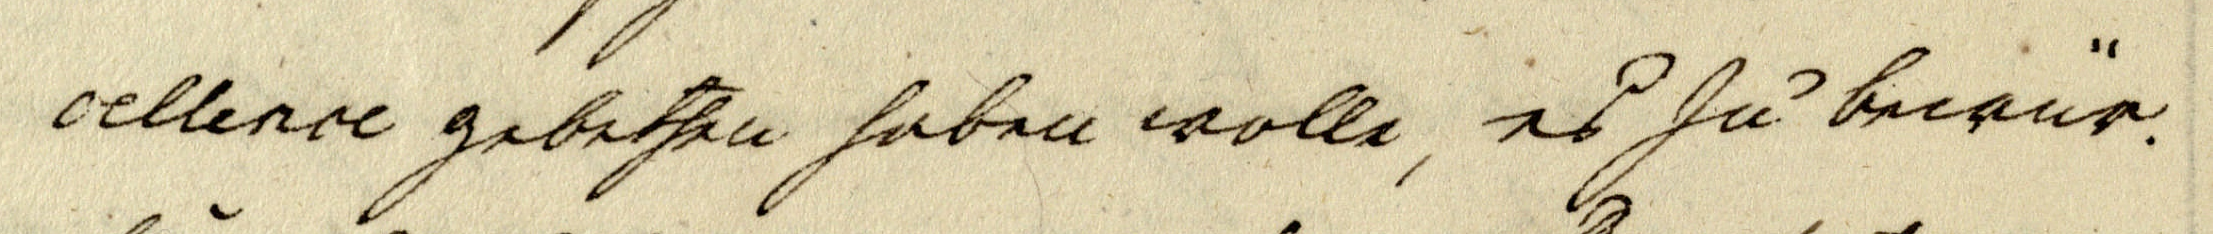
cellence gebethen haben wolle, es zu bewür¬
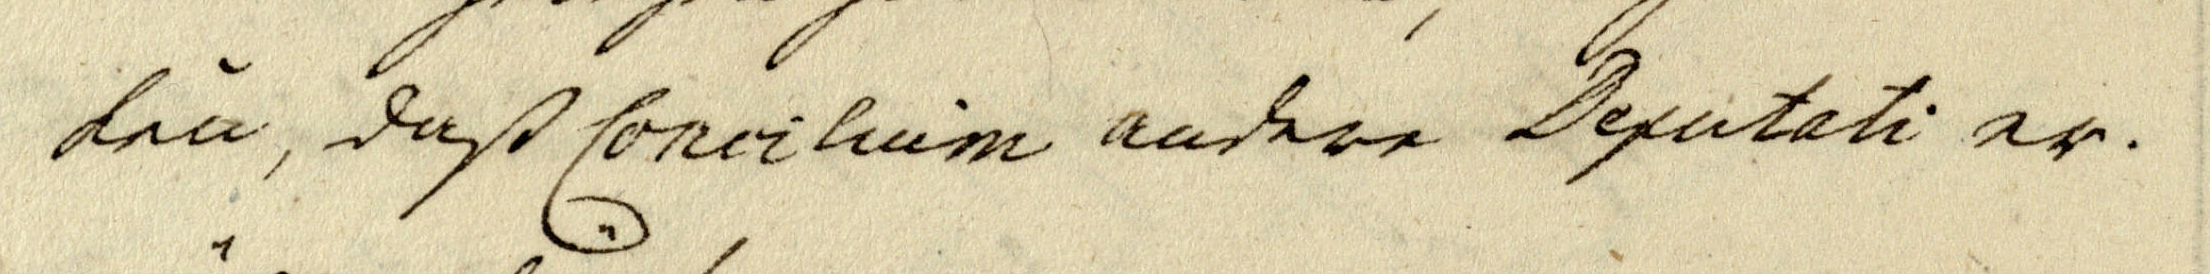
ken, daß Concilium andere Deputati er¬
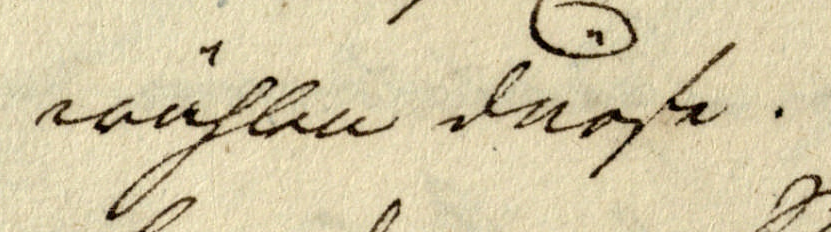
wählen dürfe.
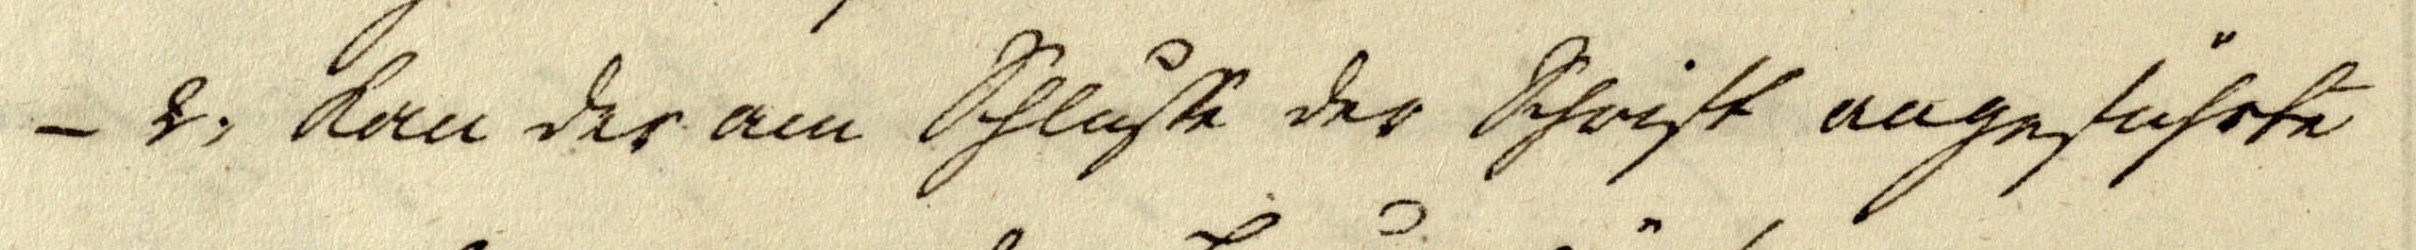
2., Kan der am Schlusse der Schrift angeführte
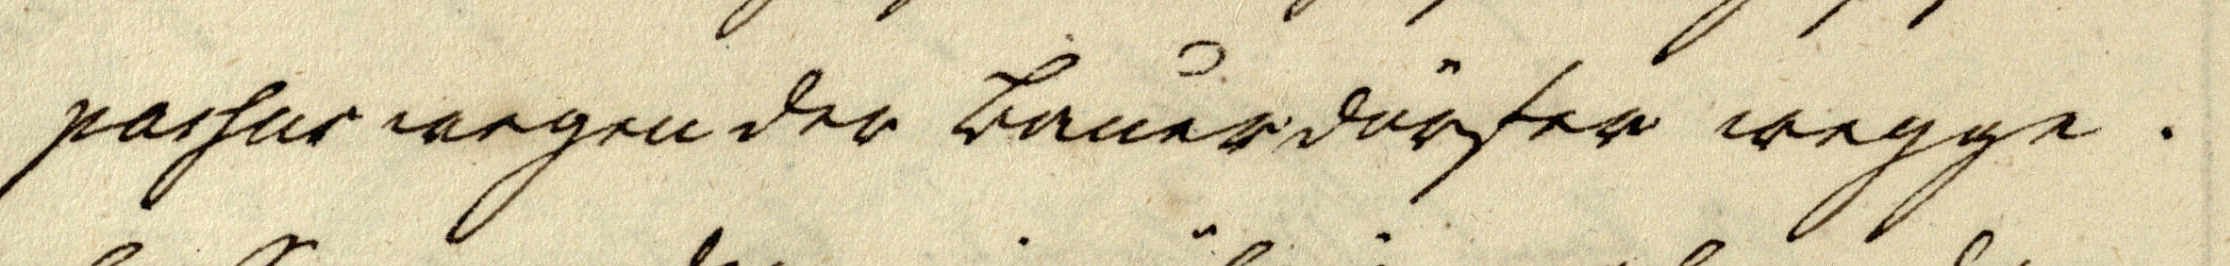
passus wegen der Bauerdörfer wegge¬
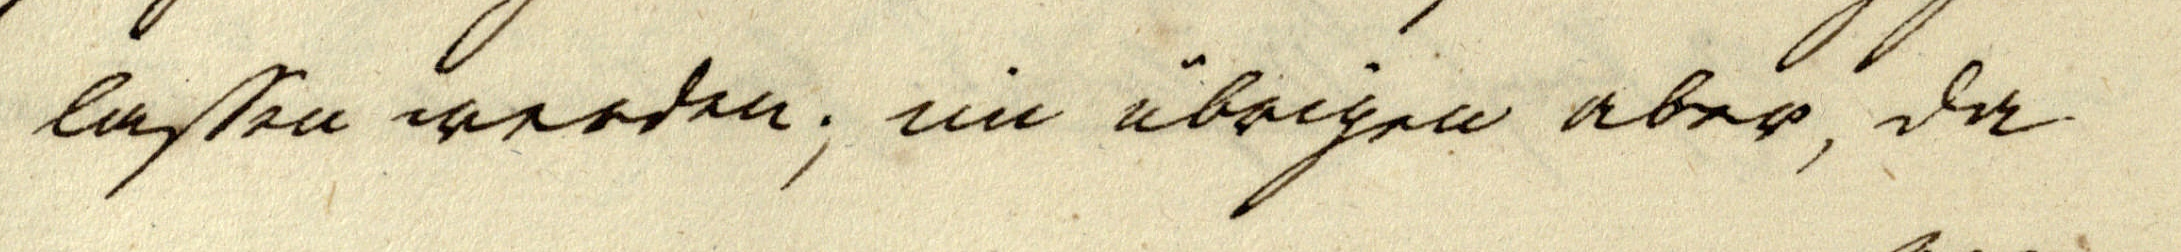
lassen werden; im übrigen aber, da
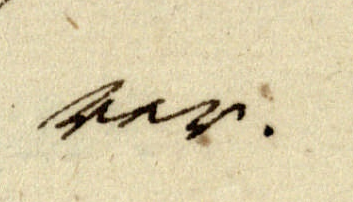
ver
